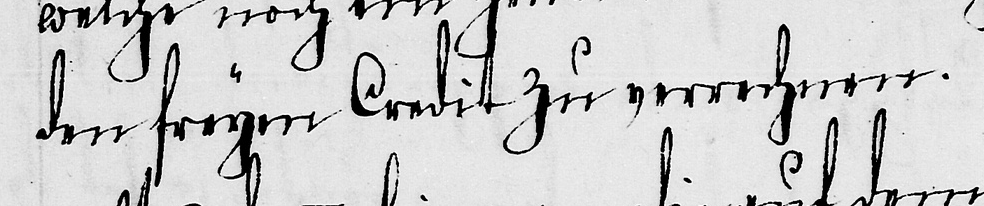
den freyen Credit zu verrechnen.
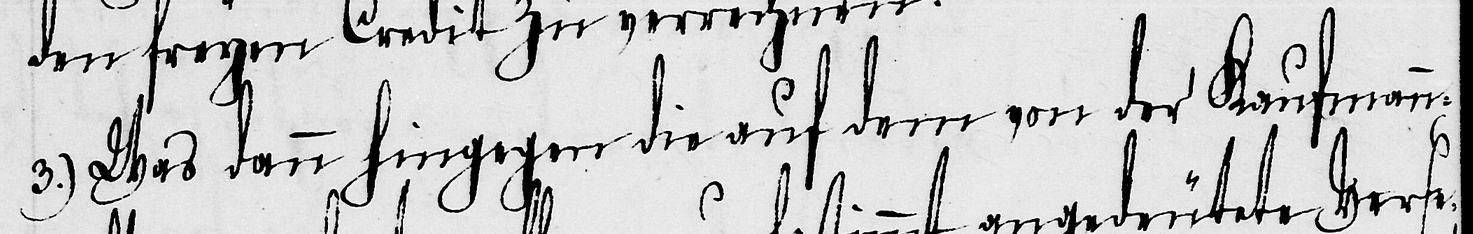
3.) Was dann hingegen die auf dem von der Kaufmann¬
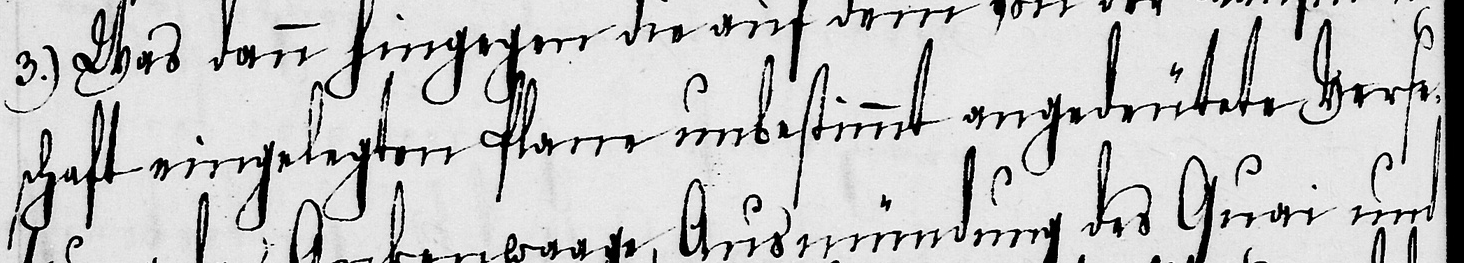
schaft eingelegten Plane unbestimmt angedeutete Versa¬
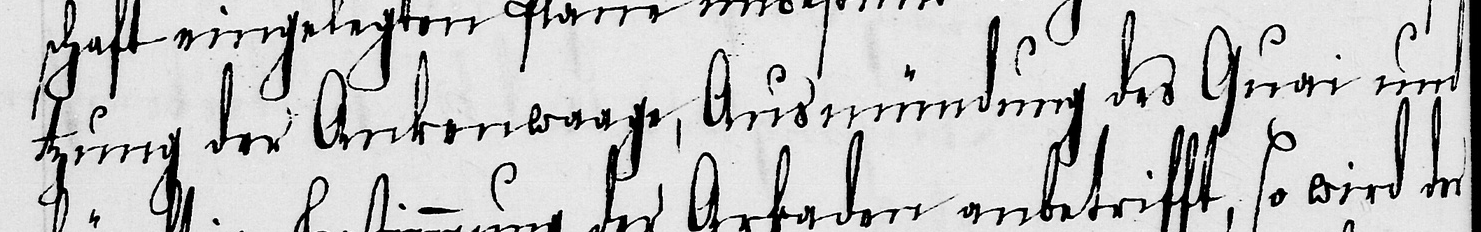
tzung der Ankenwaage, Ausmündung des Quai und
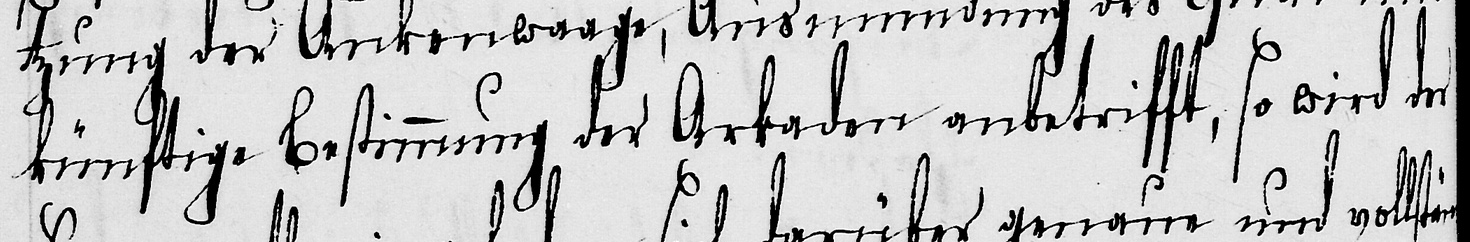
künftige Bestimmung der Arkaden anbetrifft, so wird
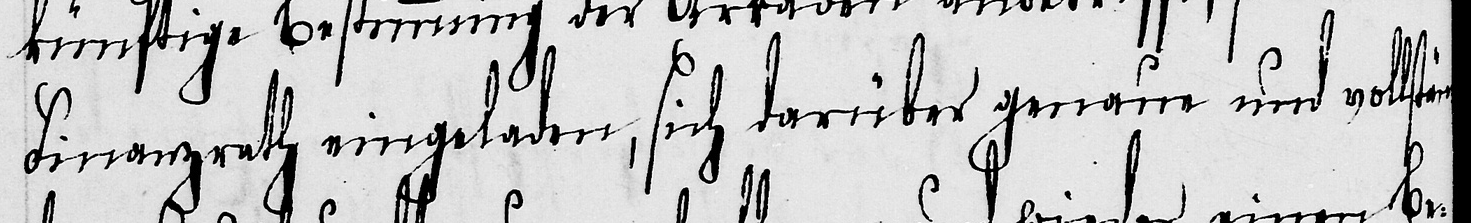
Finanzrath eingeladen, sich darüber genaue und voll¬
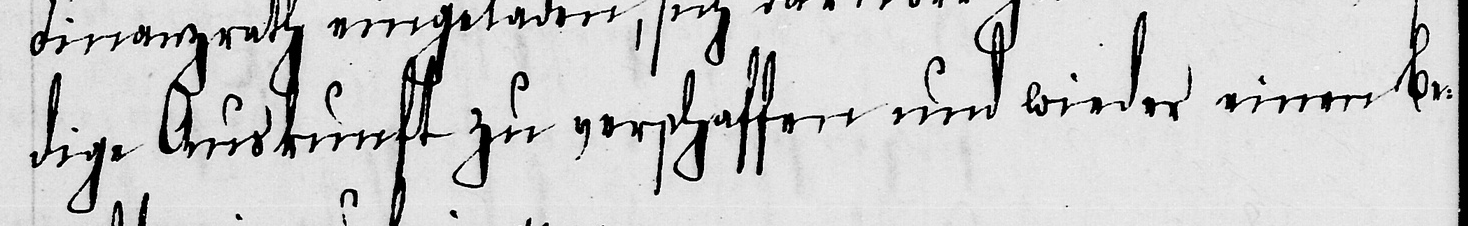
dige Auskunft zu verschaffen und wieder einen Be¬
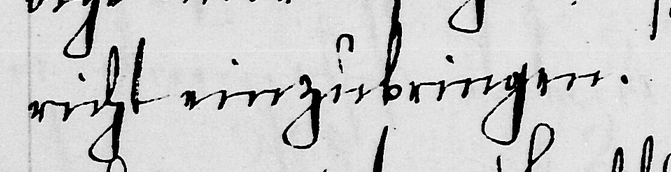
richt einzubringen.
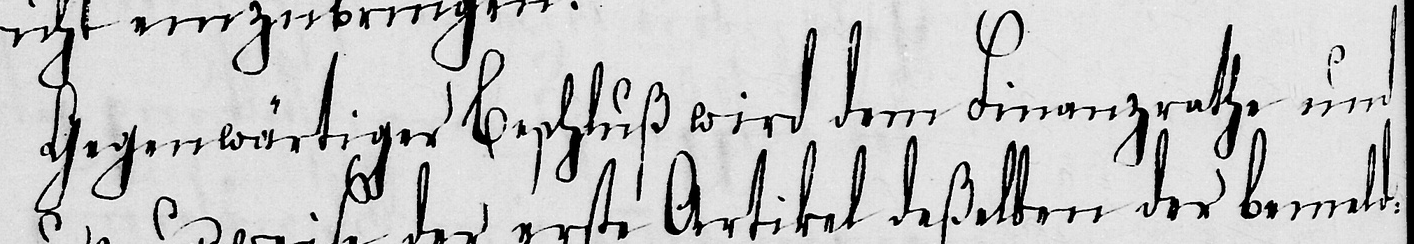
Gegenwärtiger Beschluß wird dem Finanzrathe und
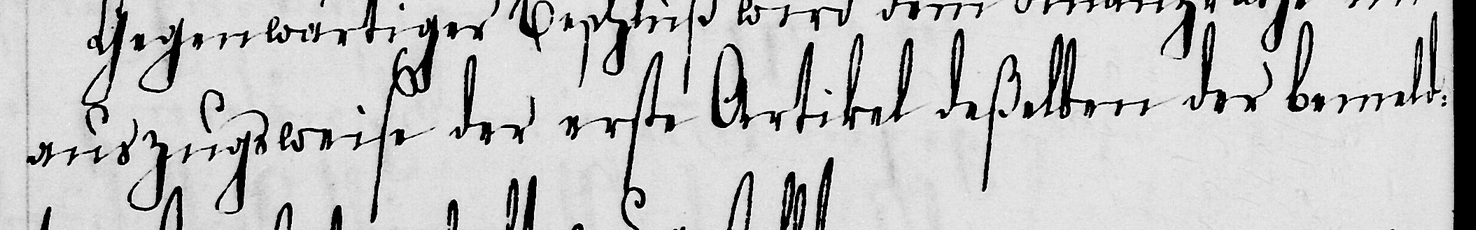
auszugsweise der erste Artikel deßelben der bemeld¬
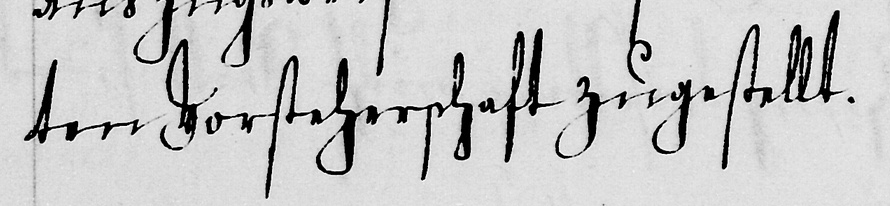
ten Vorsteherschaft zugestellt.
